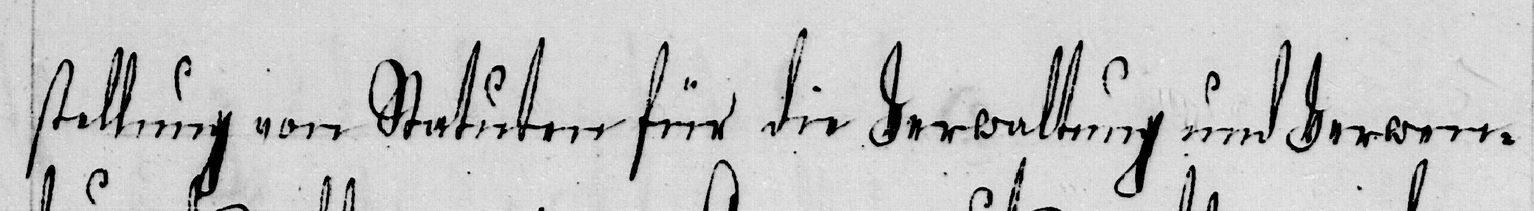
stellung von Statuten für die Verwaltung und Verwen¬
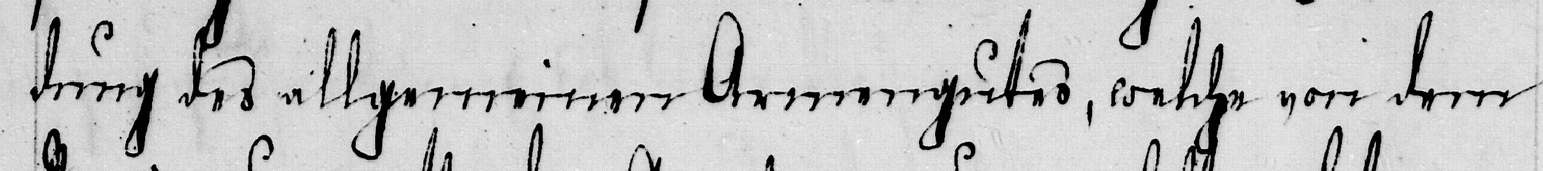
dung des allgemeinen Armengutes, welche von dem
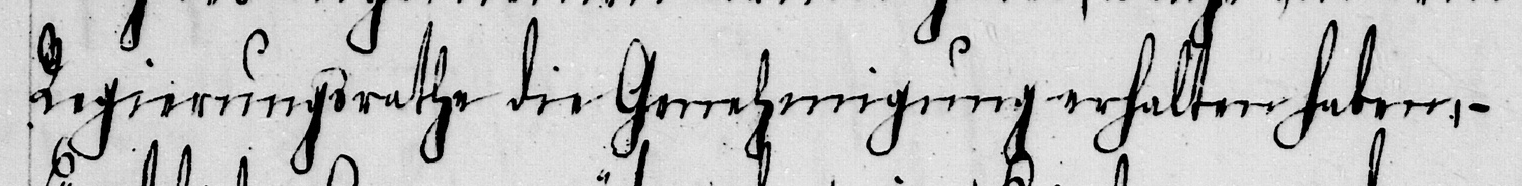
Regierungsrathe die Genehmigung erhalten haben, –
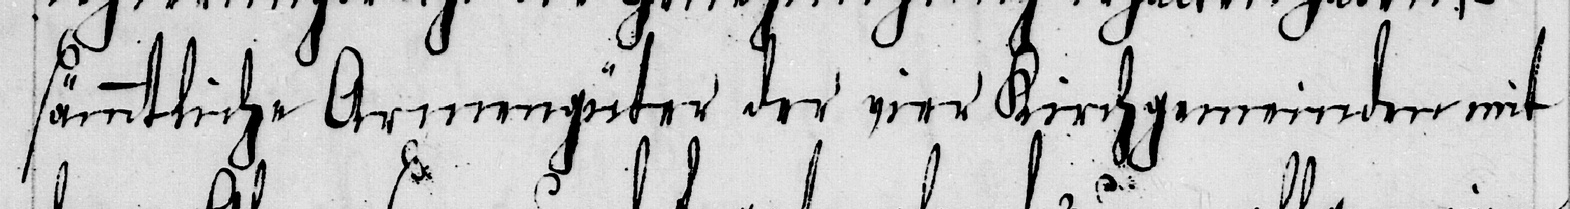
sämmtliche Armengüter der vier Kirchgemeinden mit
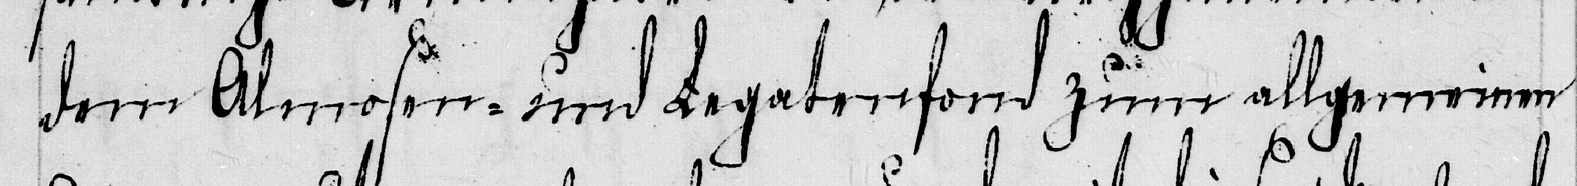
dem Almosen- und Legatenfond zum allgemeinen
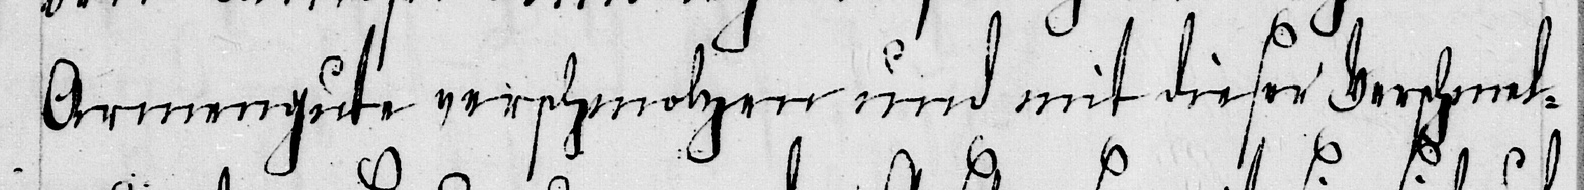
Armengute verschmolzen und mit dieser Verschmel¬
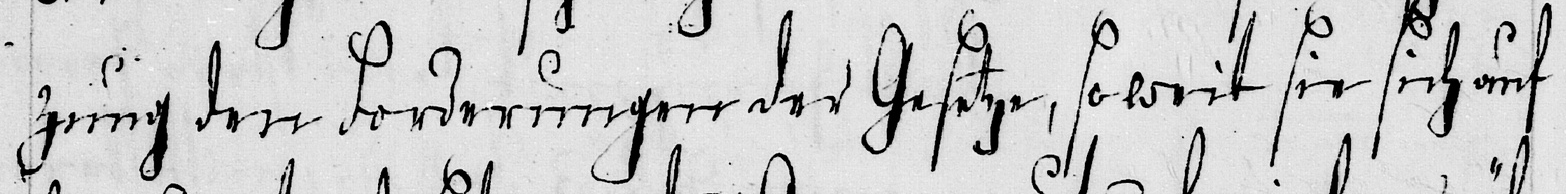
zung den Forderungen der Gesetze, soweit sie sich auf
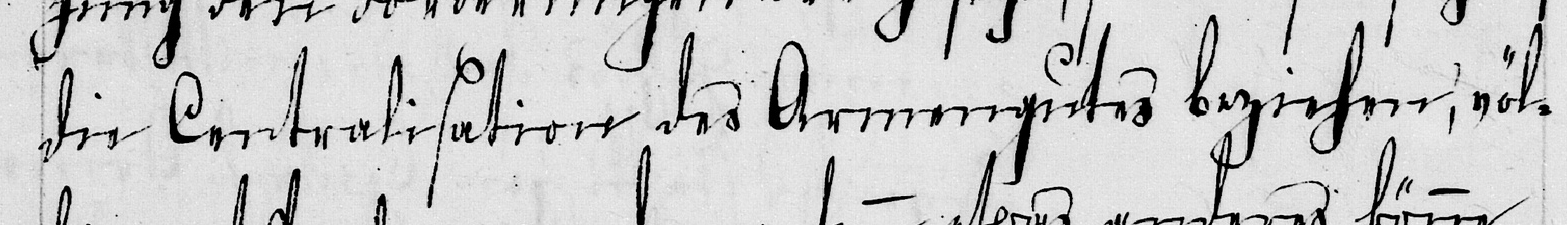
die Centralisation des Armentgutes beziehen, völ¬
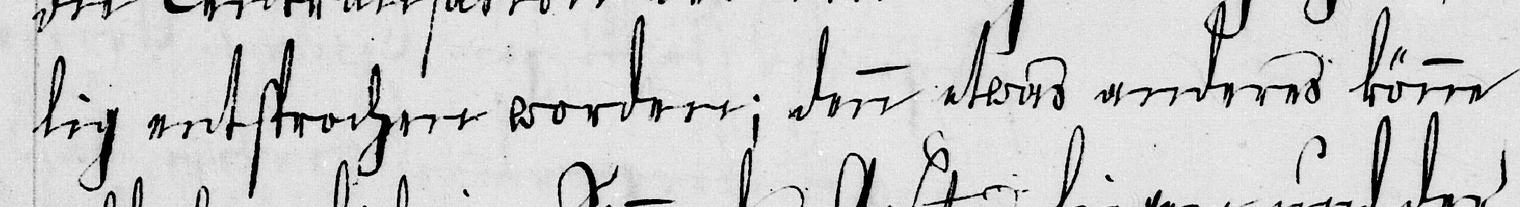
lig entsprochen worden; denn etwas anderes könne
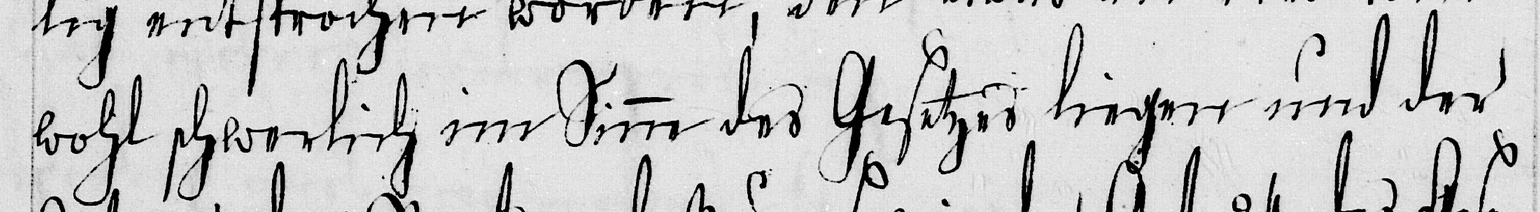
wohl schwerlich im Sinne des Gesetzes liegen und der
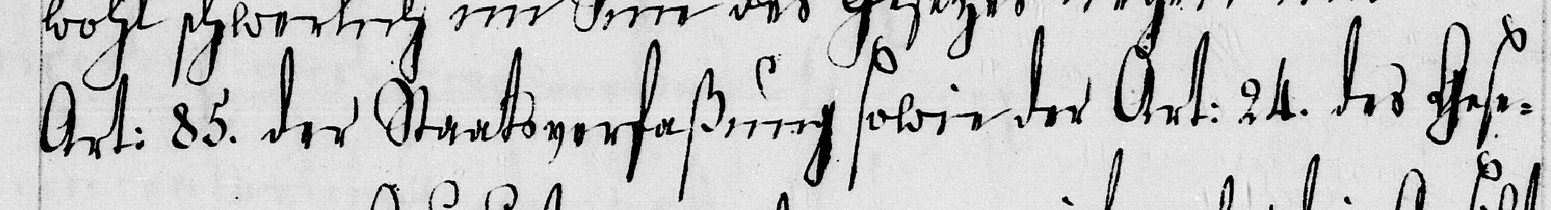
Art: 85. der Staatsverfaßung sowie der Art: 24. des Gese¬
